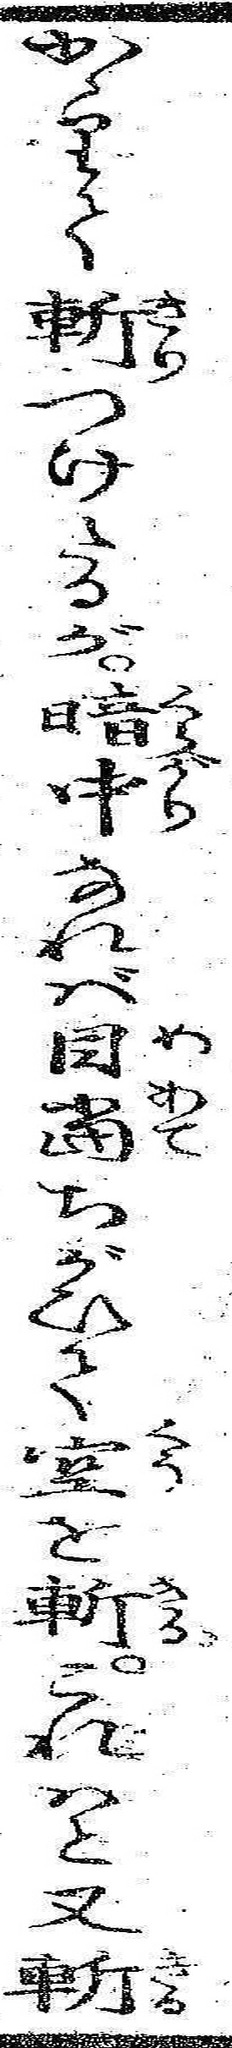かゝりて斬つけたるが。暗中なれば目当ちがひて空を斬。これはと又斬
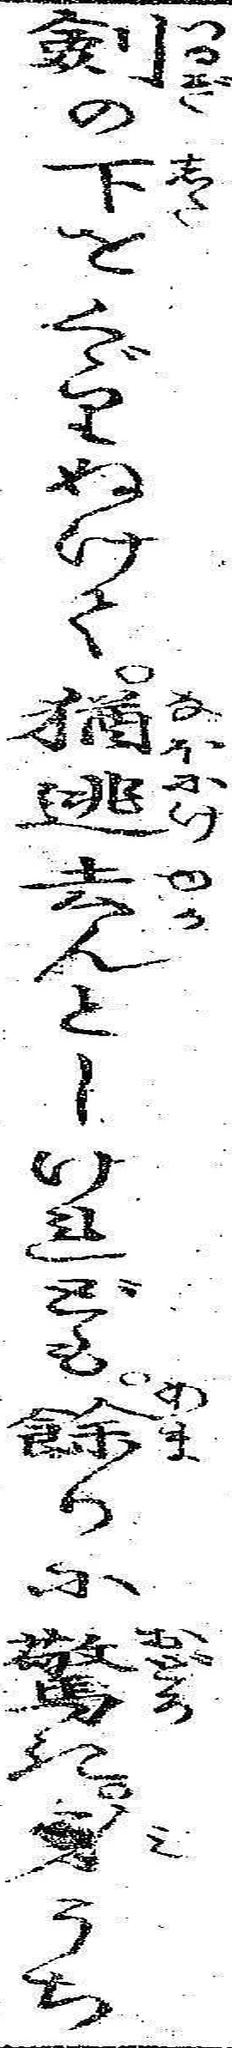剣の下をくゞりぬけて。猶逃去んとしけれども。余りに驚き。身うち
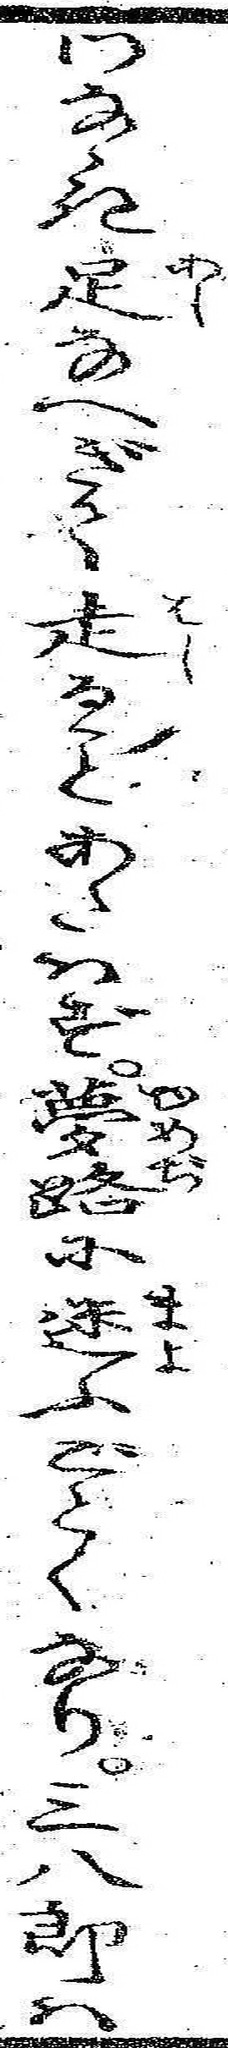わなゝき足なへぎて走ることあたはず。夢路に迷ふごとくなり。三八郎は
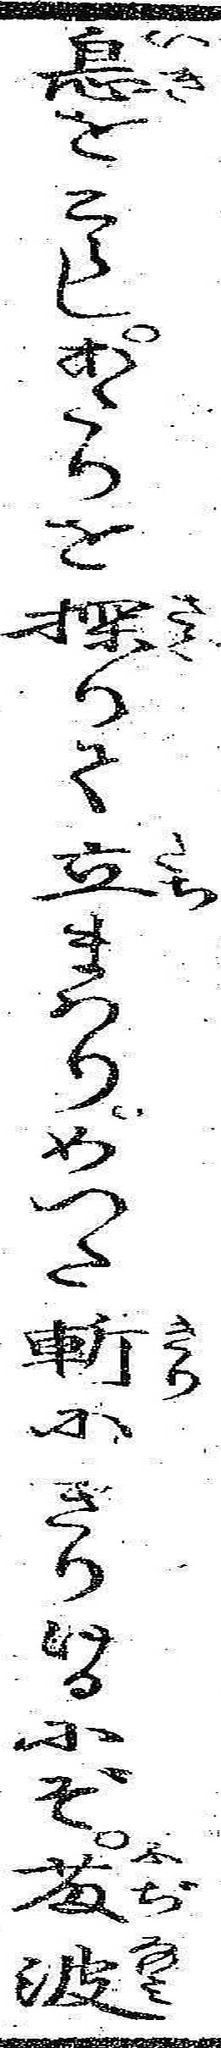息をこらし。あたりを探りて立まはり。めつた斬にきりけるにぞ。藤波
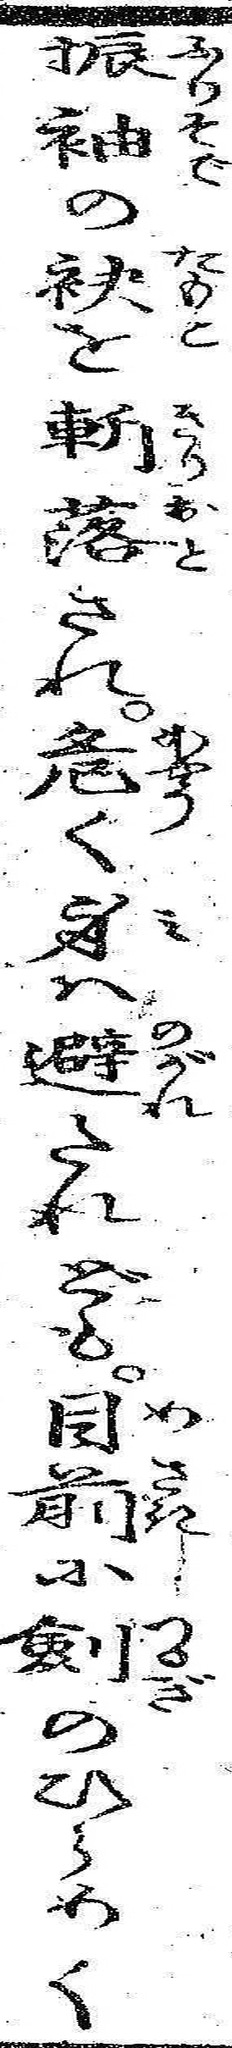振袖の袂を斬落され。危く身は避たれども。目前に剣のひらめく
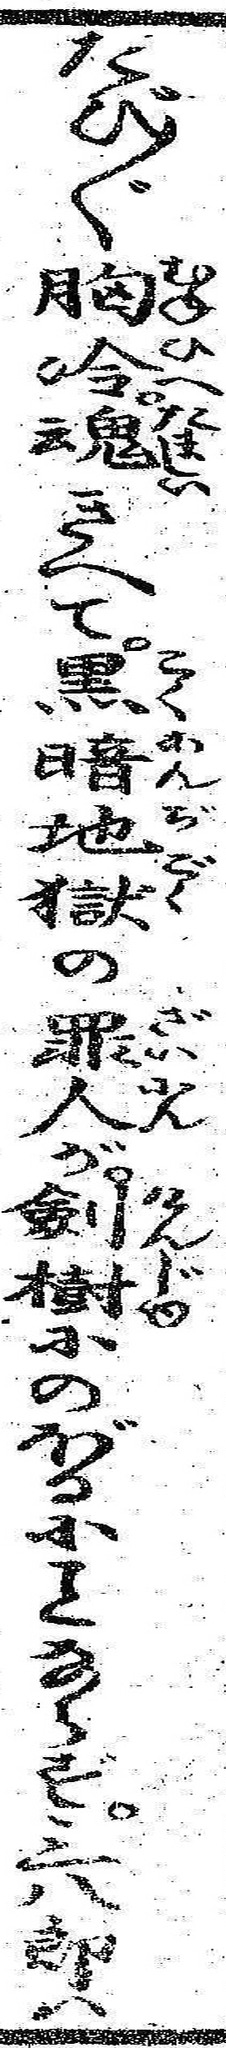たび〴〵胸冷。魂きへて。黒暗地獄の罪人が。剣樹にのぼることならず。三八郎は
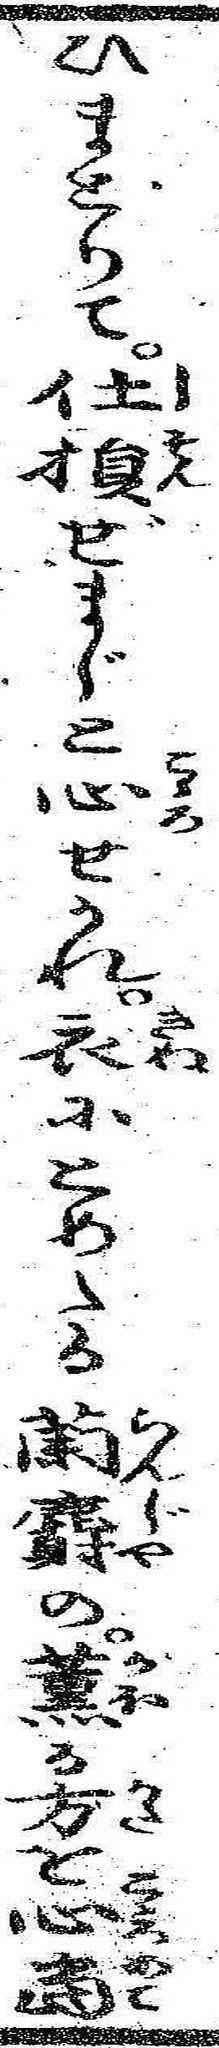ひまとりて。仕損ぜまじと心せかれ。衣にとめたる蘭麝の。薫る方を心当
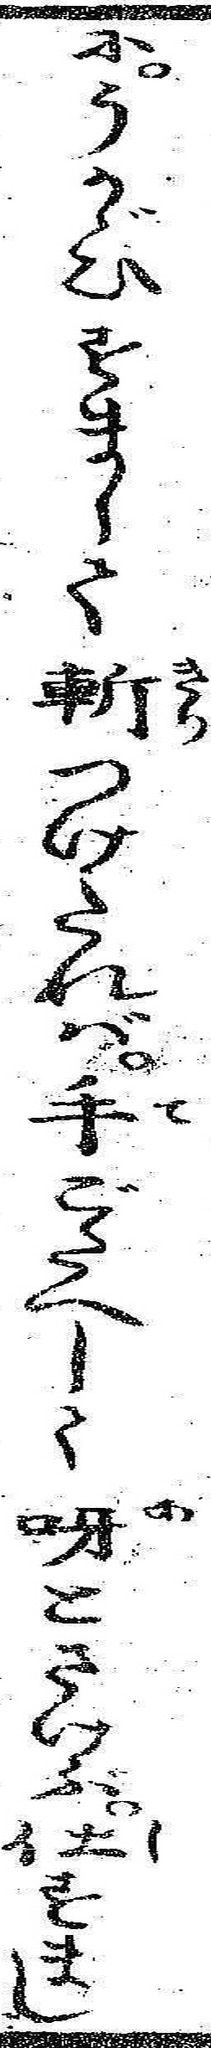に。うかゞひすまして斬つけたれば。手ごたへして呀とさけぶ。仕すまし
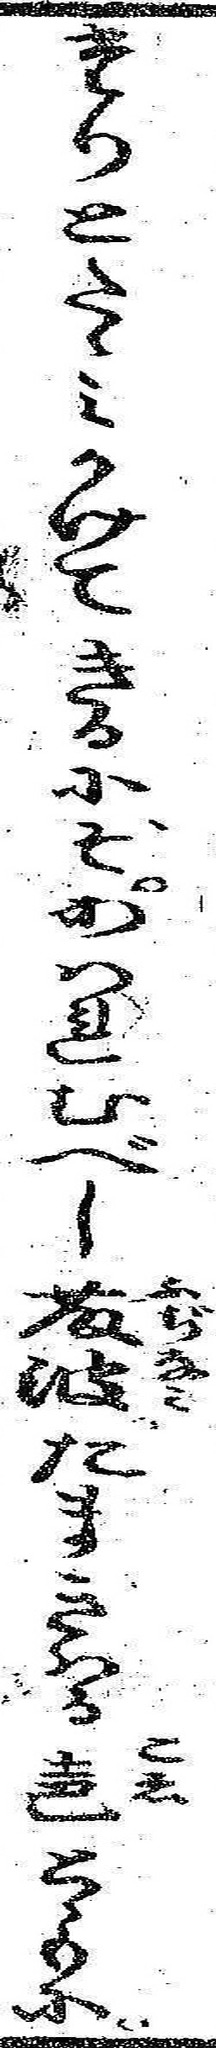たりとたゝみかけてきるにぞ。あはれむべし藤波。たまきはる声とゝもに。
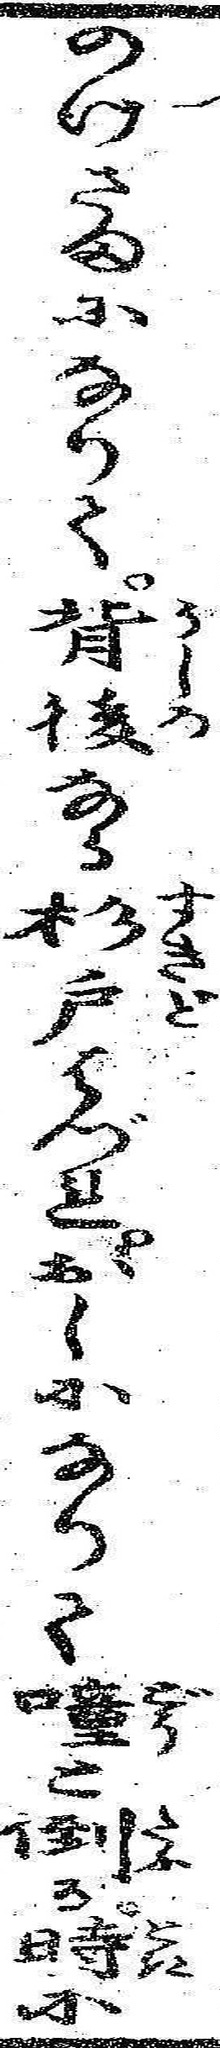のけさまになりて。背後なる杉戸はづれ。おしになりて噇と倒る。時に
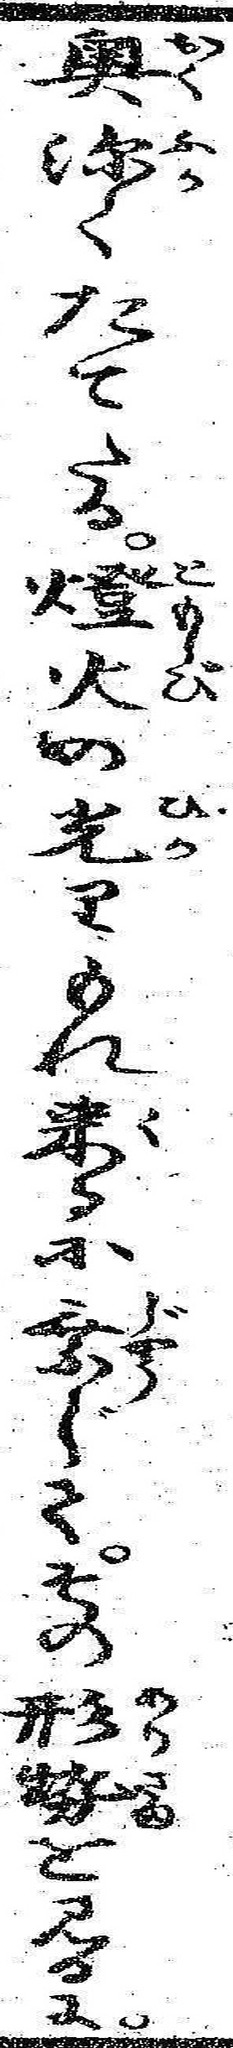奥深くたてたる。灯火の光りもれ来るに乗じて。その形勢を見るに。
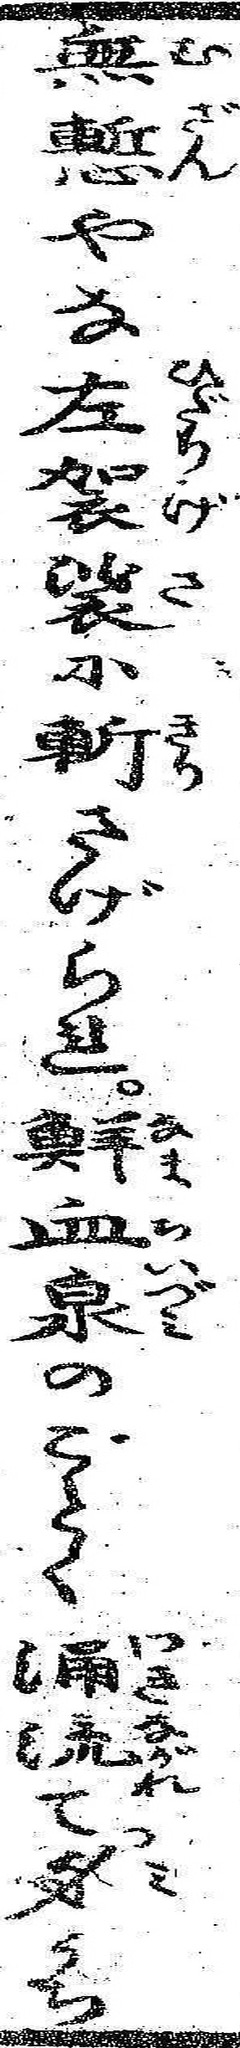無慙やな左袈裟に斬さげられ。鮮血泉のごとく湧流て。身うち
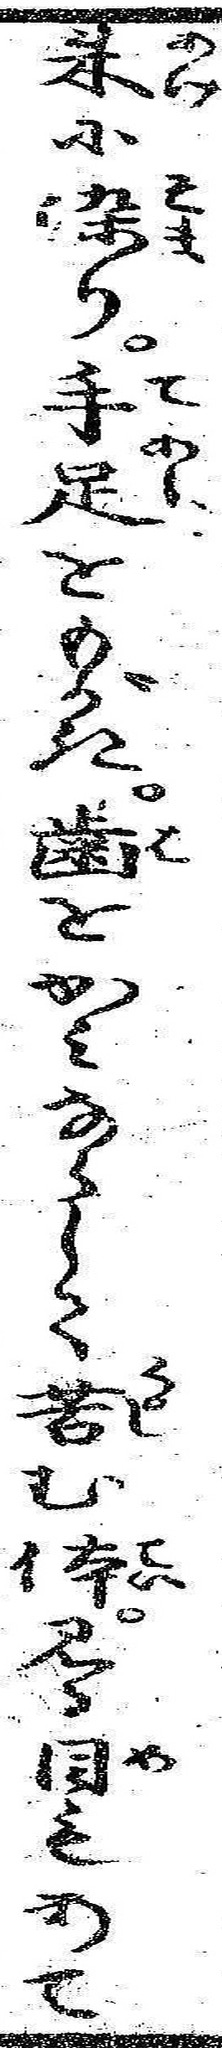朱に染り。手足をもがき。歯をかみならして苦む体。見る目もあて
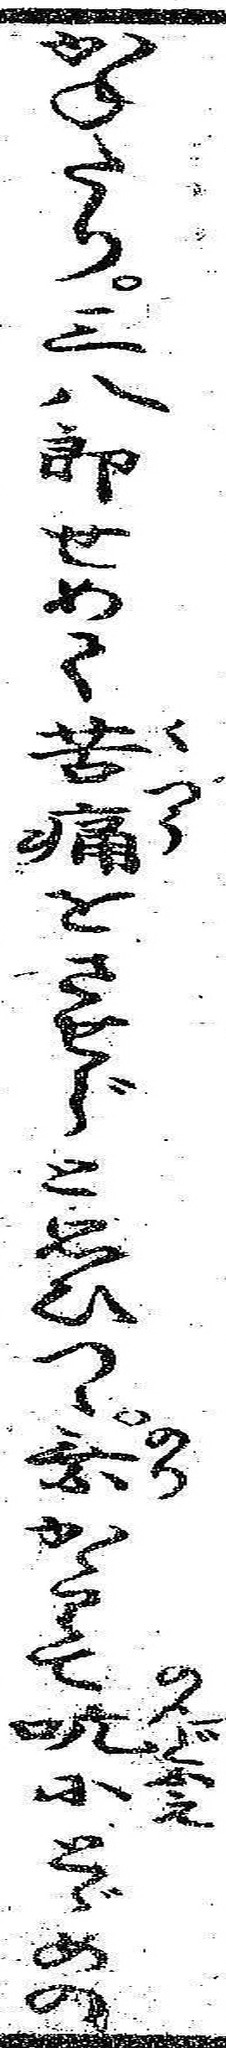かねたり。三八郎せめて苦痛をさせじと思ひつゝ。乗かゝりて吭にとゞめの
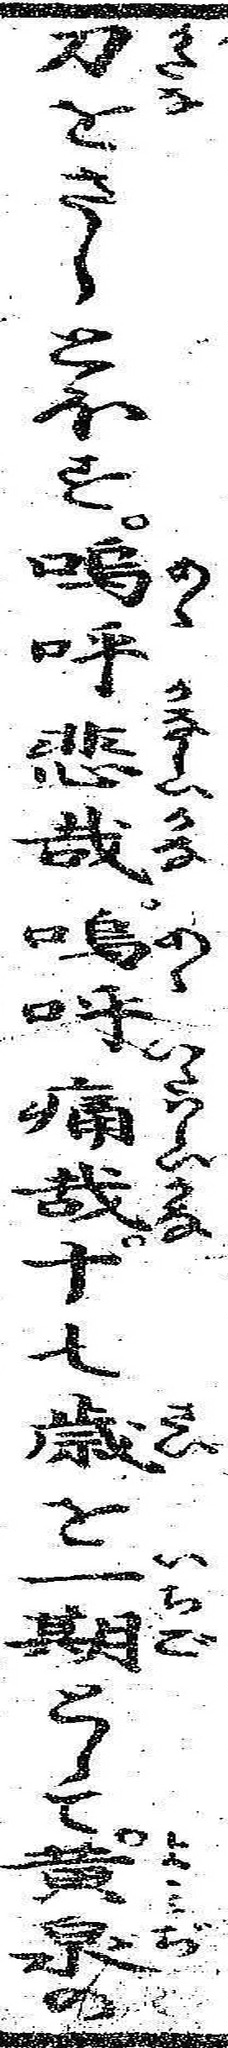刀をさしとほす。嗚呼悲哉。嗚呼痛哉。十七歳を一期として。黄泉の
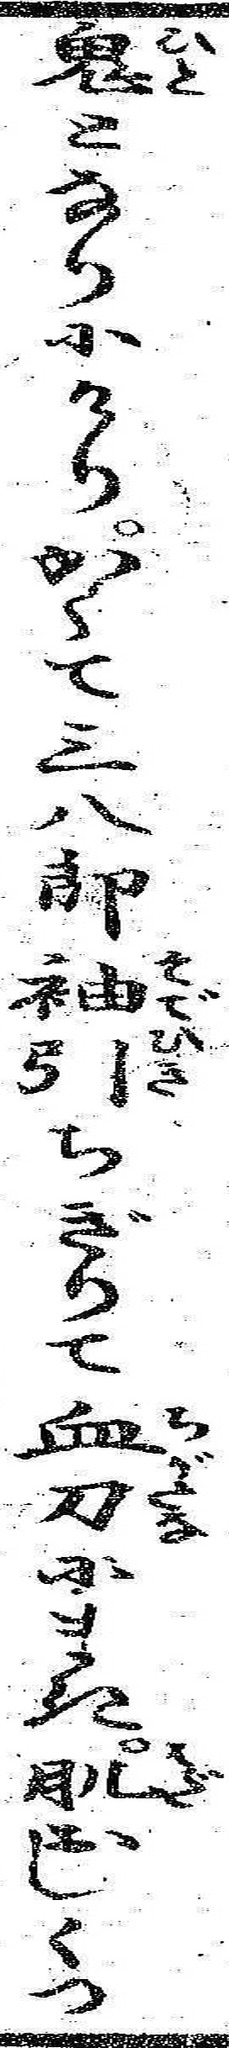鬼となりにけり。かくて三八郎袖引ちぎりて血刀にまき。肌おしくつ
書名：昔話稲妻表紙
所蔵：国文学研究資料館
